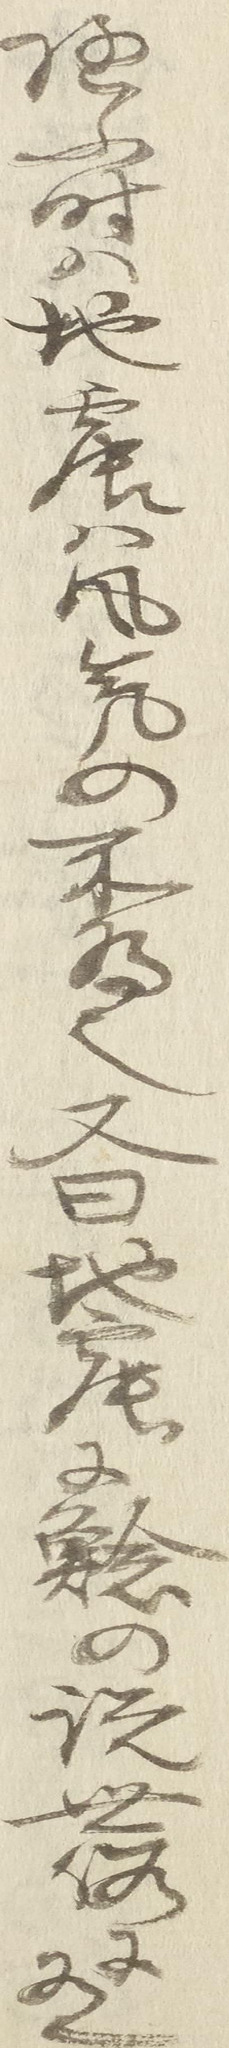随ふ時は地震は風気の所為也又曰地震に鯰の説世俗に有

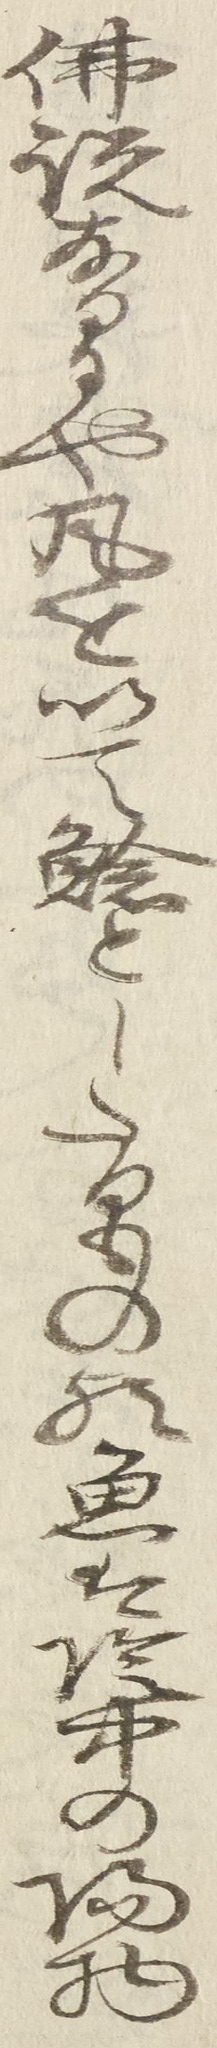仏説なるにや風を以て鯰としたるもの歟魚は陰中の陽物
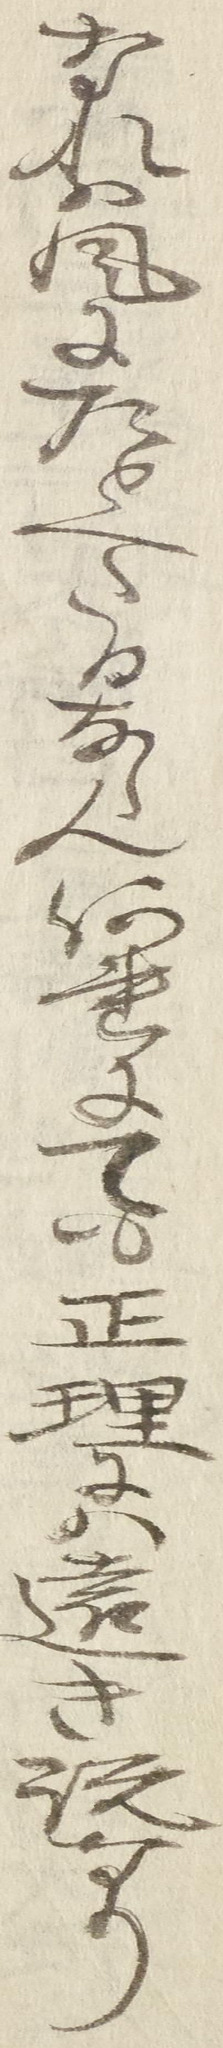なれは風にたとへたるならん何事にても正理には遠き説なり
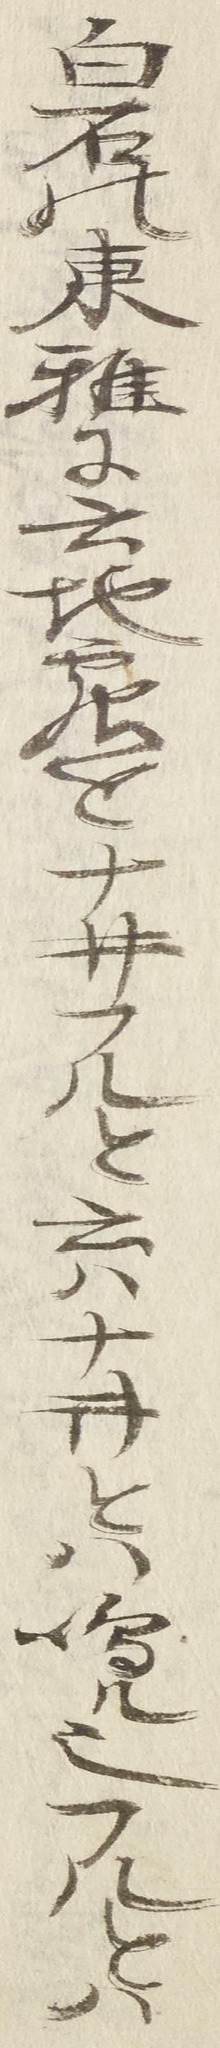白石の東雅に云地震をな井ふると云はな井とは鳴る也ふるとは
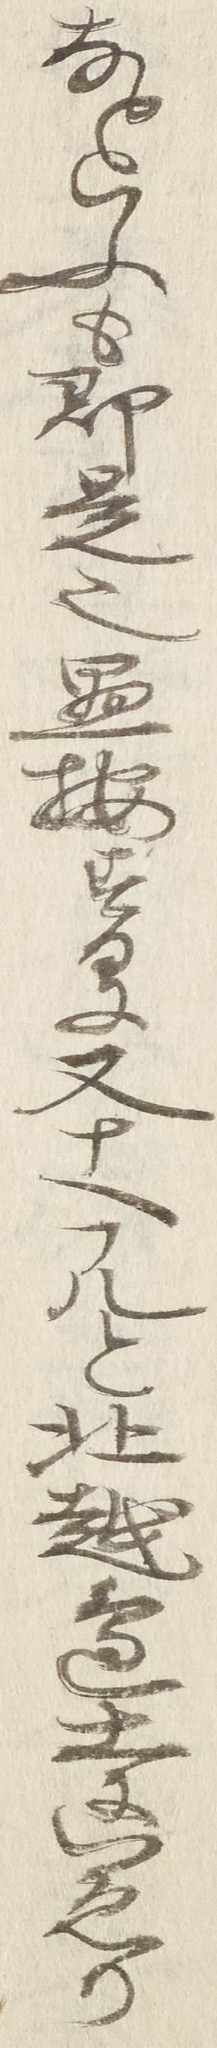などいふも即是也愚按るに又なへふると北越辺土にいえり
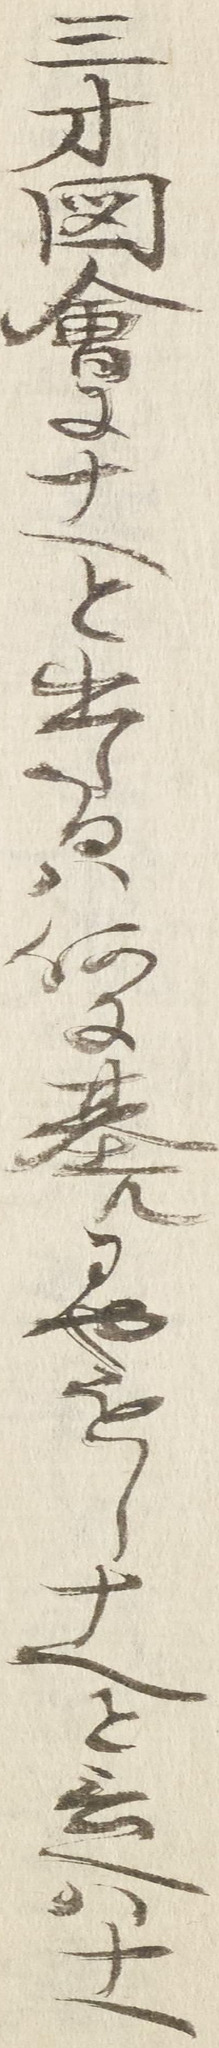三才図会になへと出たるは何に基るにやもしなへと云へはなへ
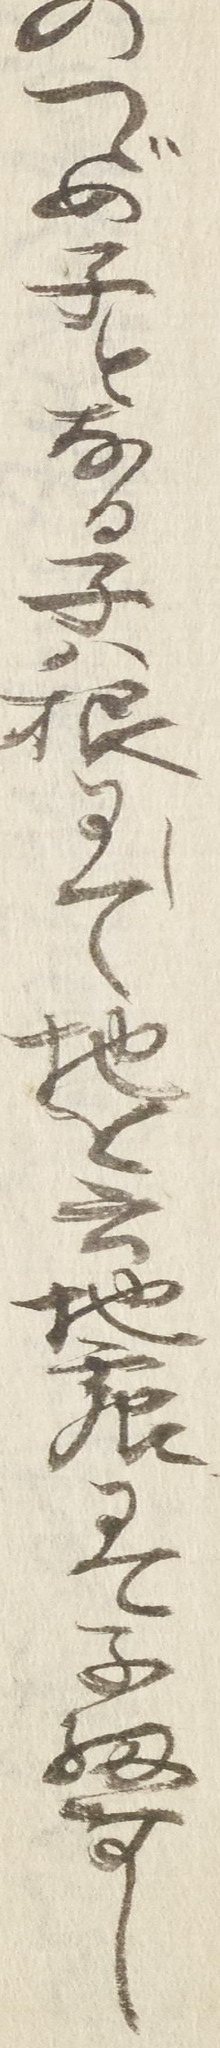のつゞめ子となる子は根にして地を云地震にて子細なし
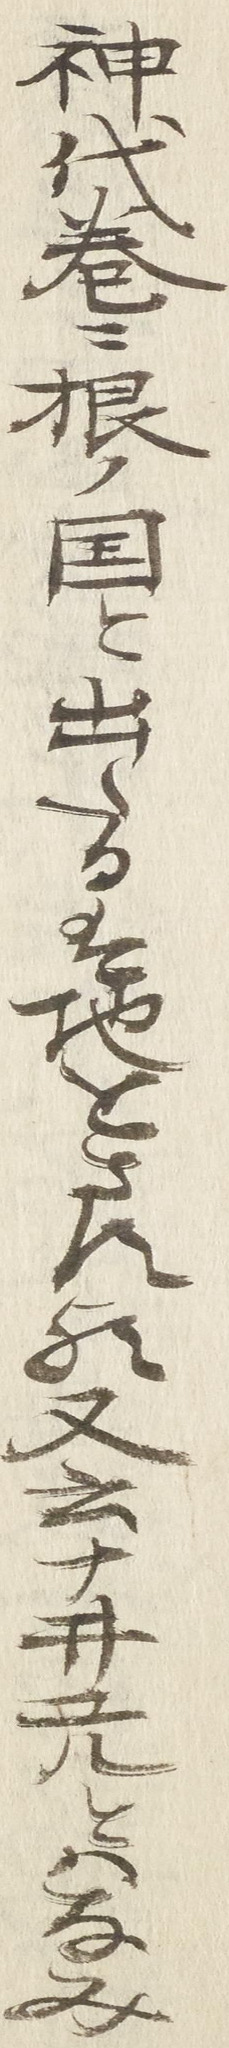神代巻に根之国と出たるは地をさす歟又云な井ゆるとはなみ
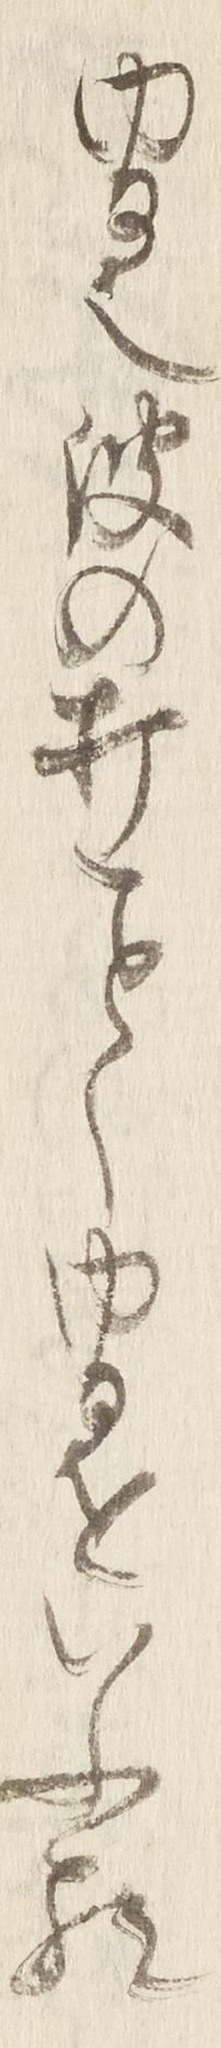ゆる也波の打ことくゆるをいふ歟
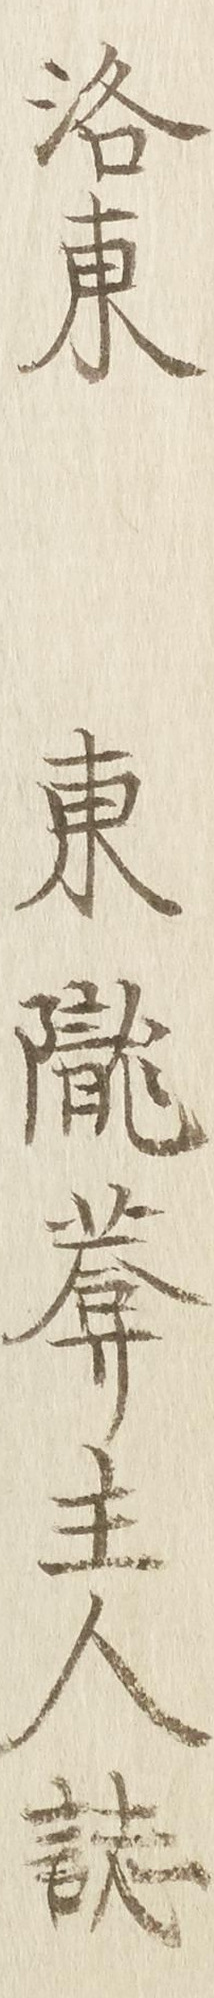洛東東瀧菴主人誌
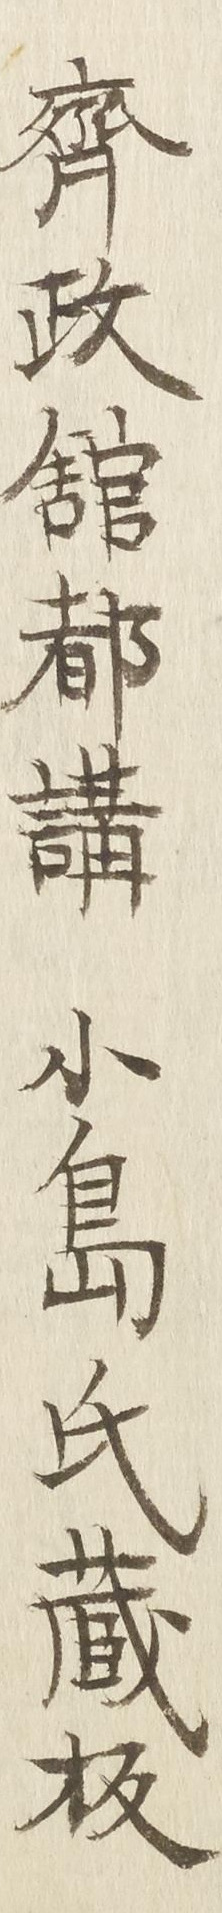斉政館都講小島氏蔵板
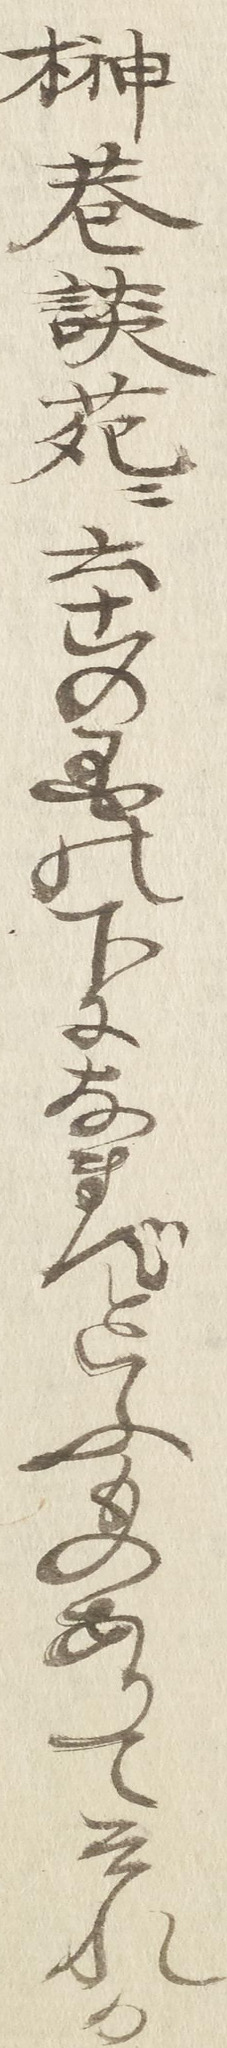榊巷談苑に云この国の下になまずといふものありてそれか
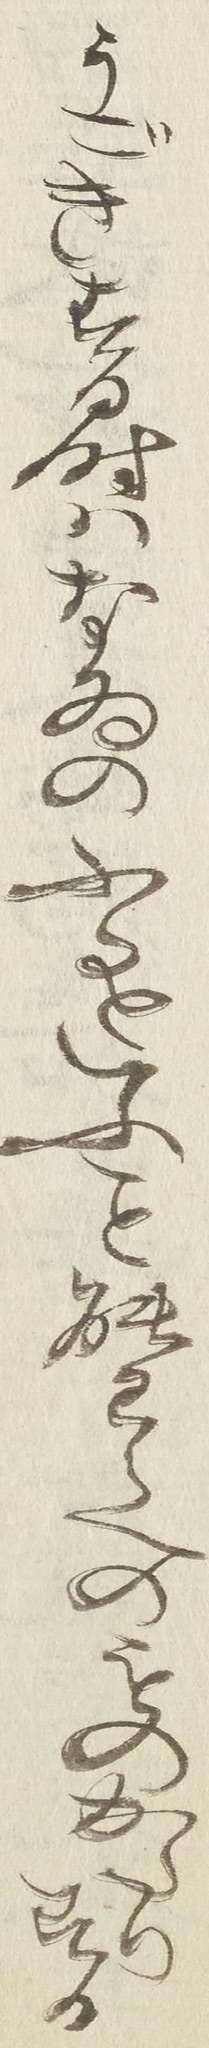うごきする時はなゐのふるといふこと能わらへのものかたりする
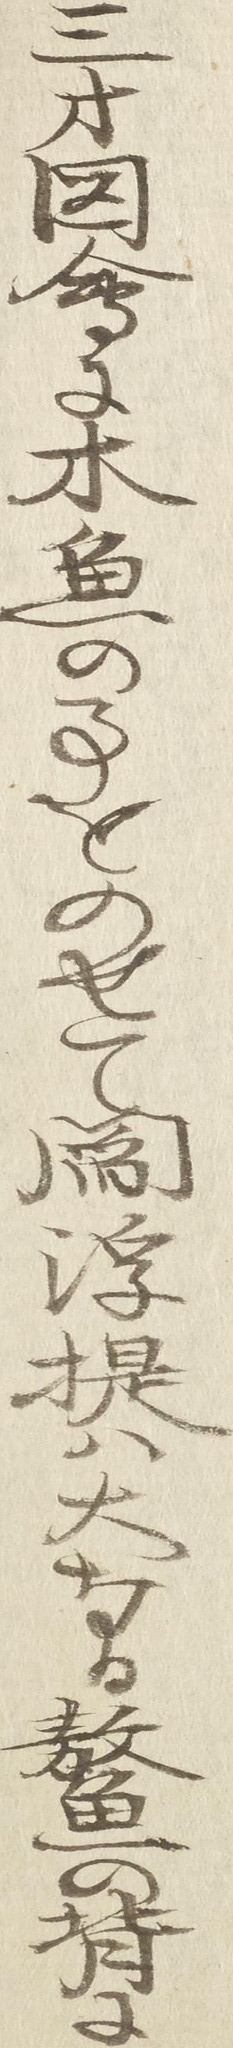三才図会に木魚の事をのせて閻浮堤は大なる鰲の脊に
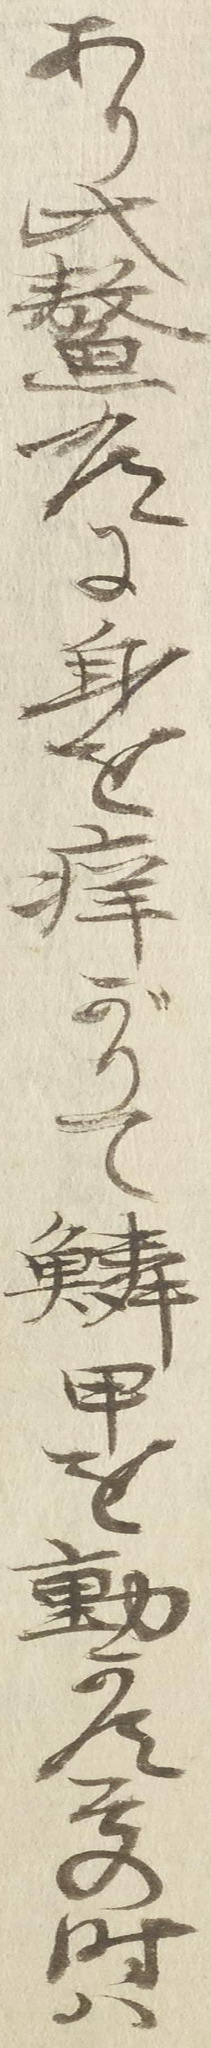あり此鰲常に身を痒がりて鱗甲を動かすその時は
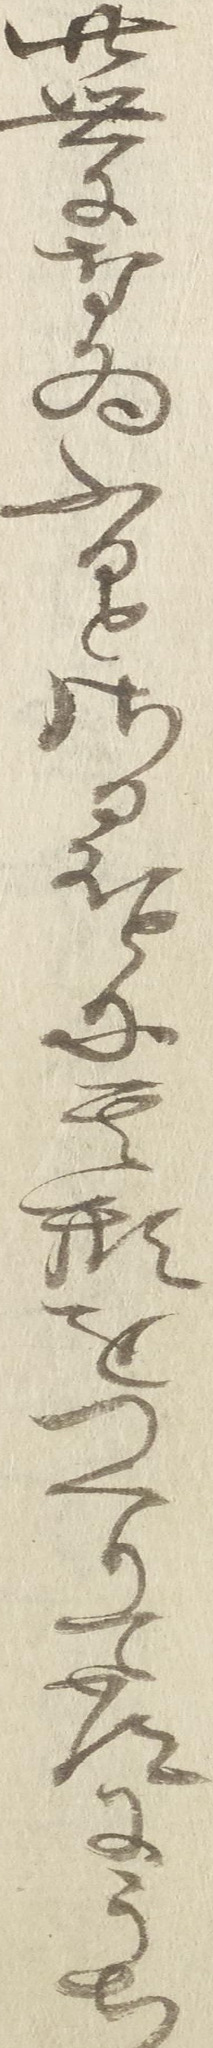此世になゐふるとするほとに其形をつくりて常にうち
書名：地震記　下
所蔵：東京大学地震研究所図書室 Earthquake Research Institute Library, The University of Tokyo, JAPAN
